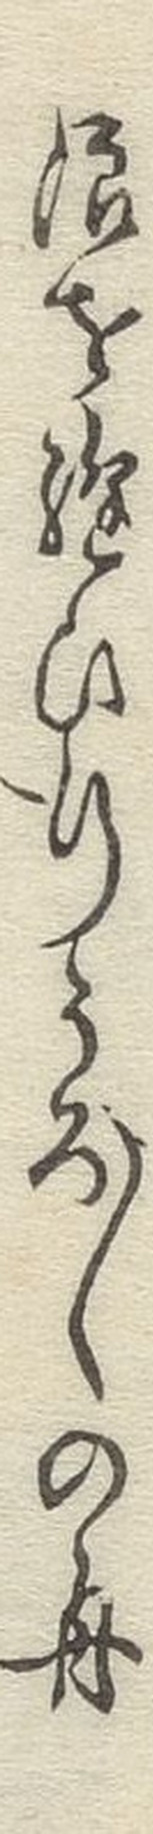浪を縫ひ行うろ〳〵の舟
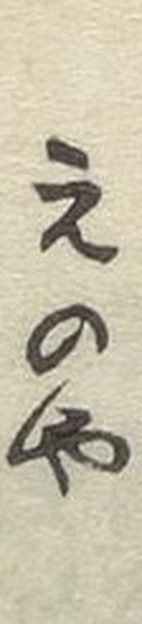えのや
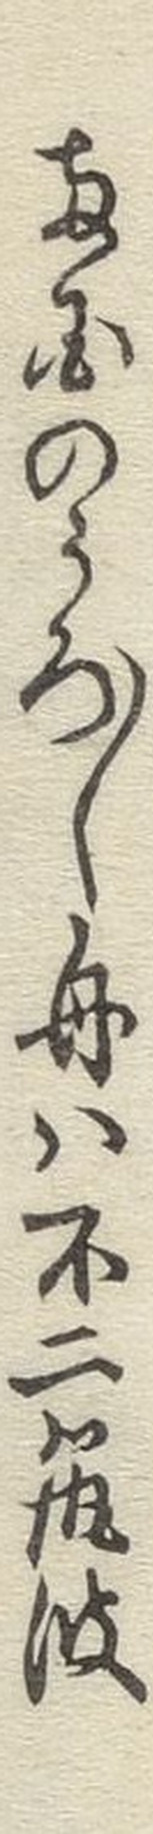両国のうろ〳〵舟は不二筑波
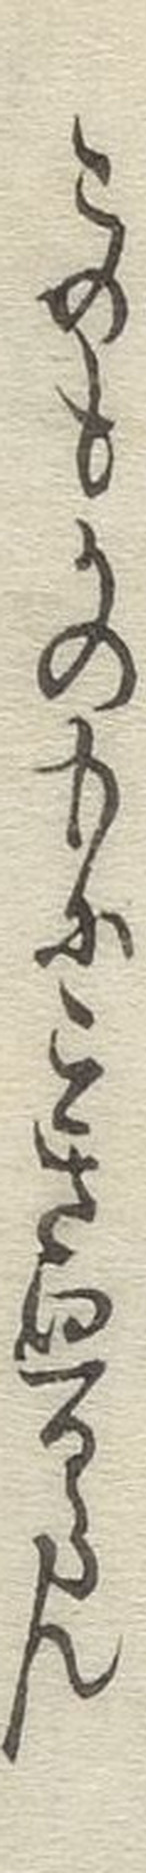このもかのもにこき廻るらん
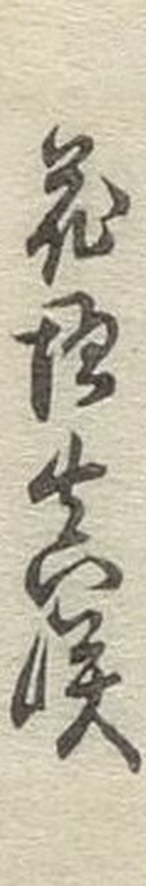花垣真咲
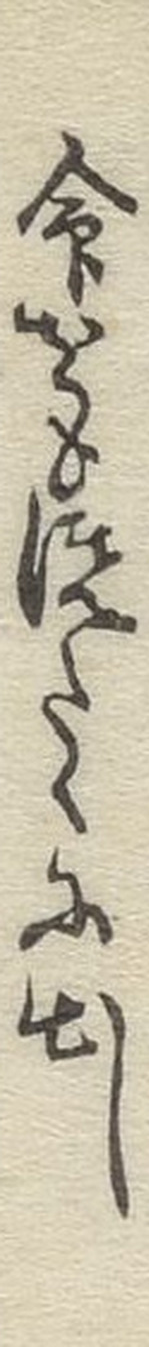命をも洗たくに出し
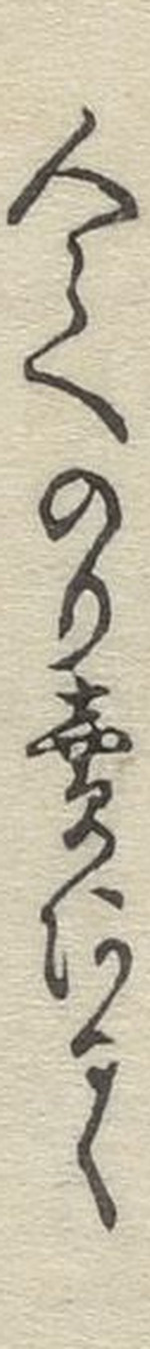人々へのり売あるく
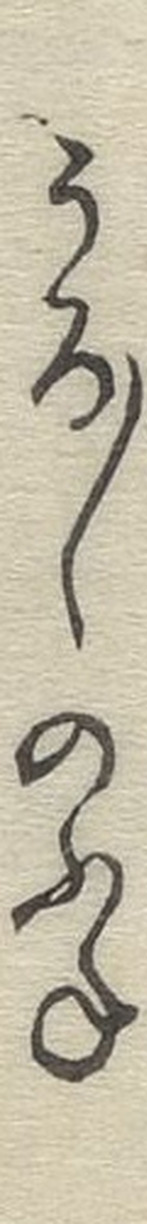うろ〳〵の舟
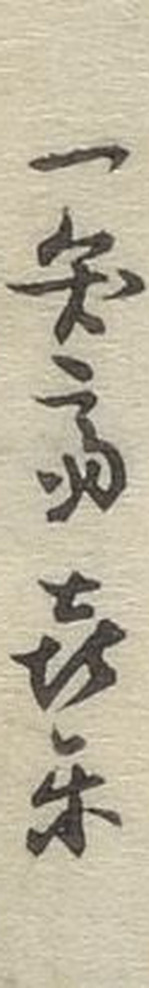一矢斎喜楽
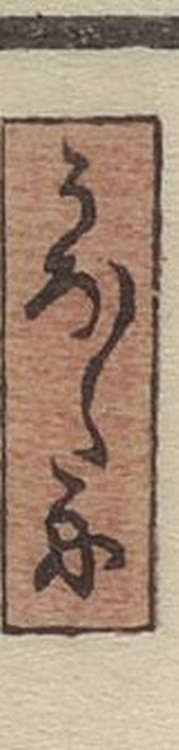うろ〳〵舟

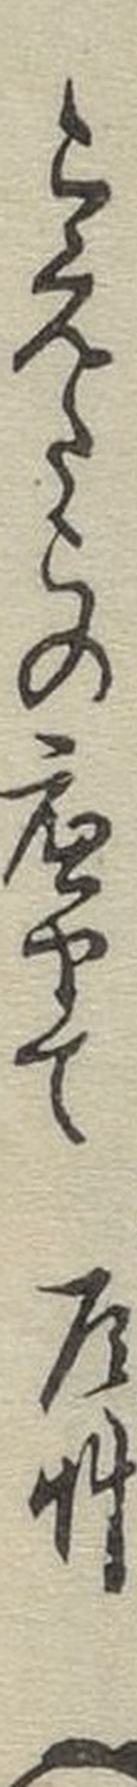こえたこの底まて道草
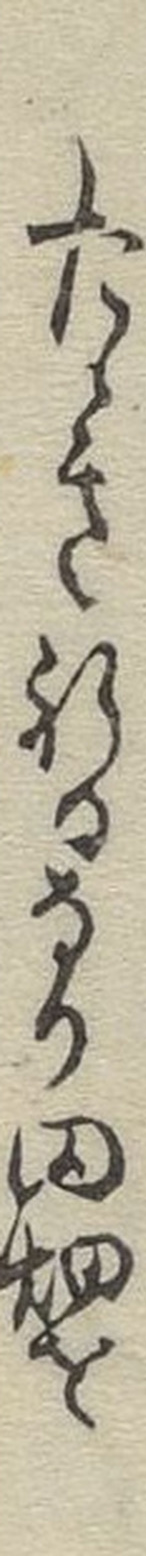たゝき祈るなり田畑を
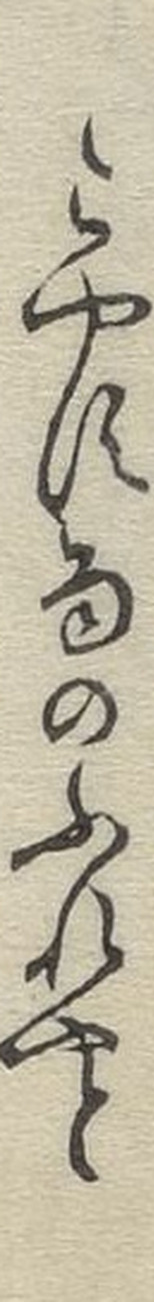こやす雨のふれやと
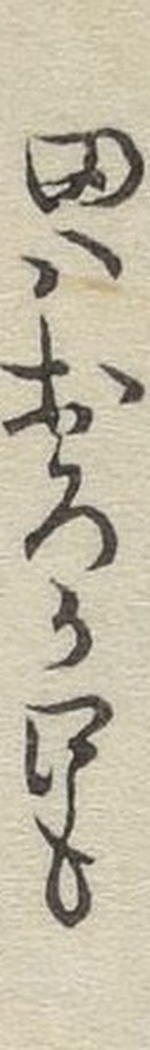田はおろか口も
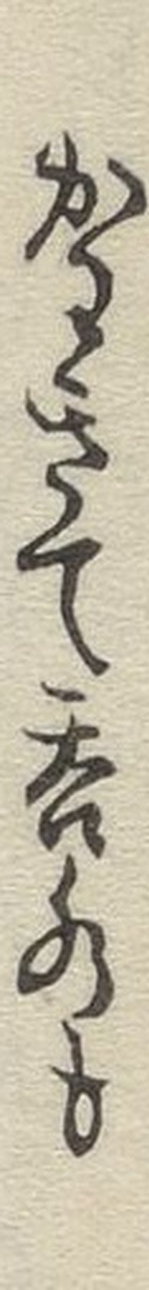かわ来て呑水も
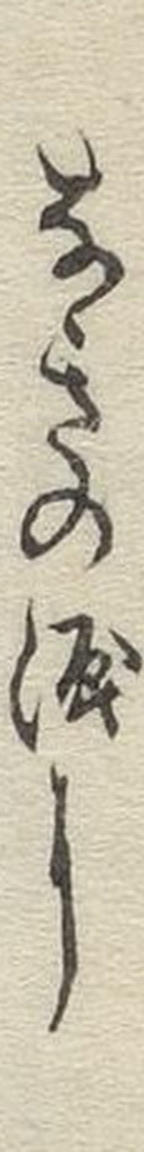なきの涙に
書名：Picture Album of People with Kyōka (Light Verse) (Kyōka shiki jinbutsu 狂歌四季人物)
